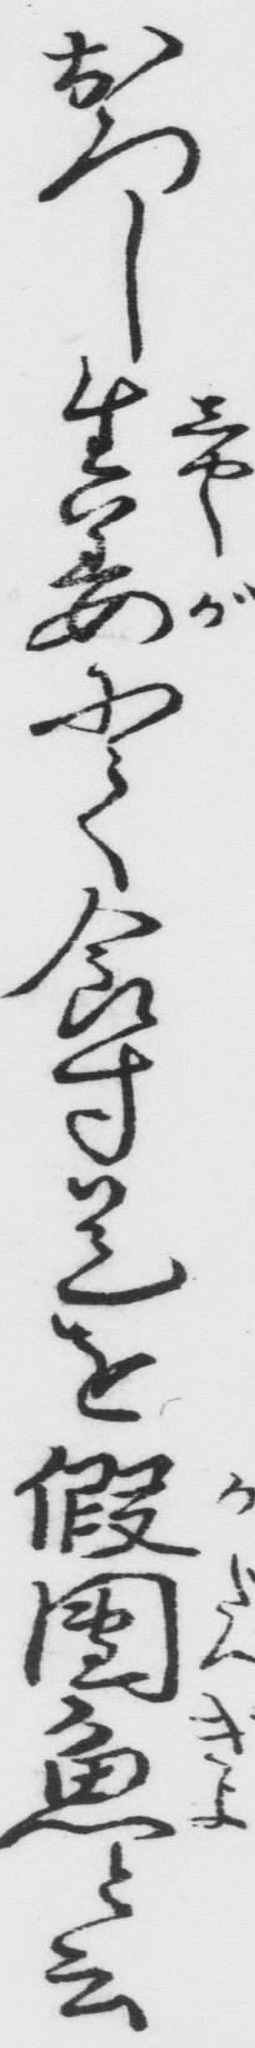おろし生姜にて食す是を假團魚と云
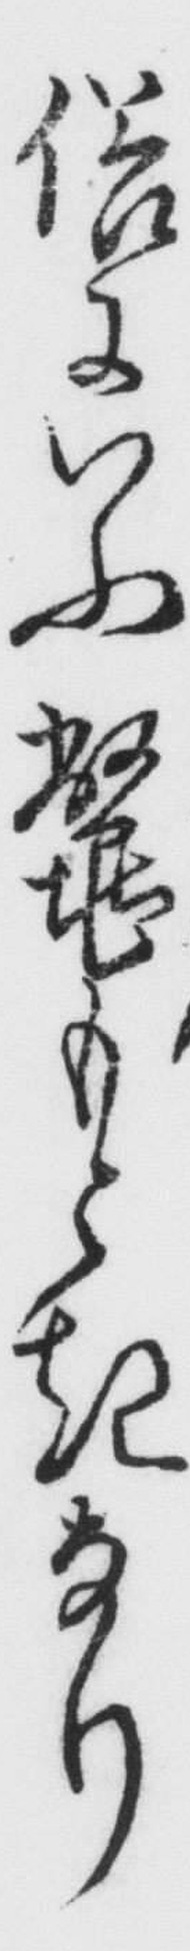俗にいふ鼈もときなり
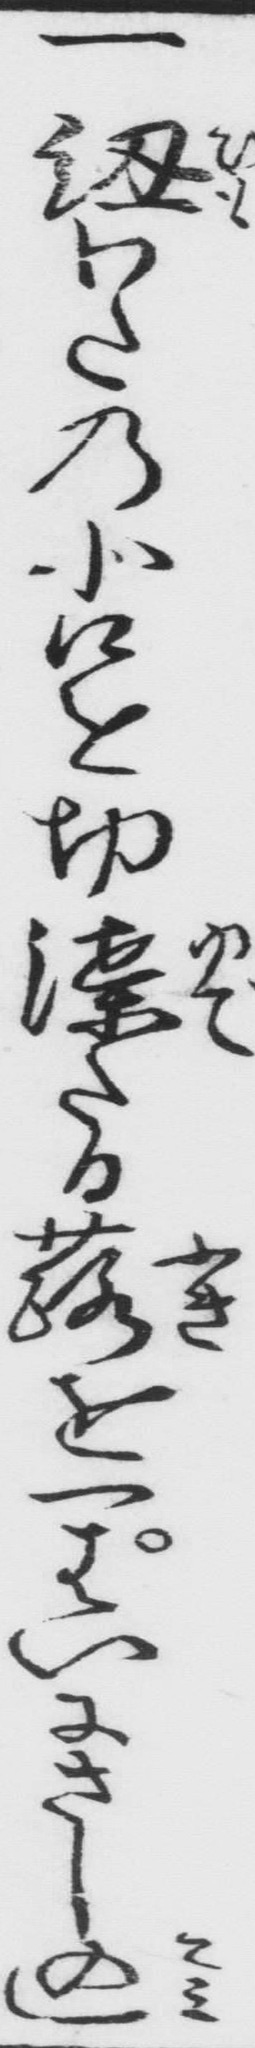一紐わたの小口を切渫たる蕗を一ぱいにさし込
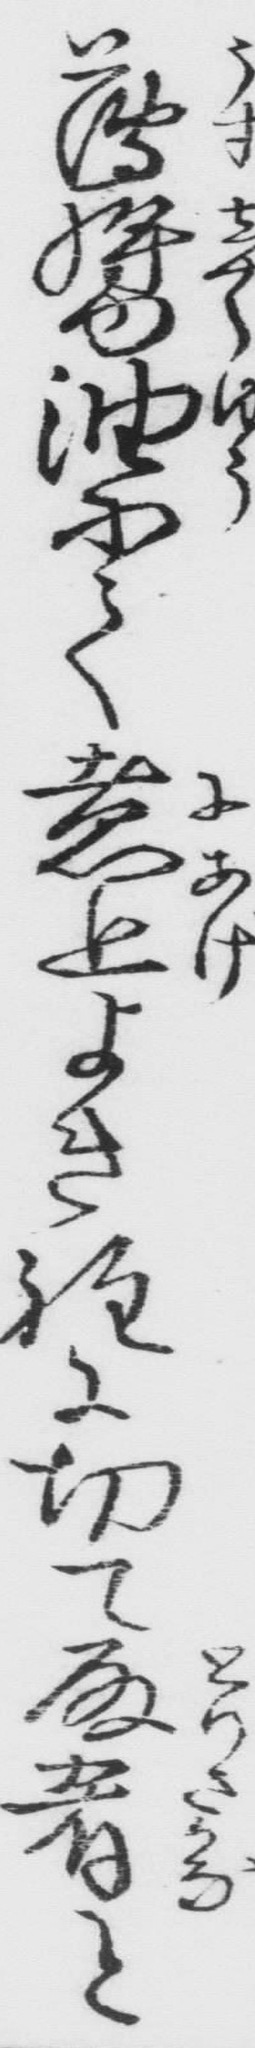薄醤油にて煮上よき程に切て取肴と
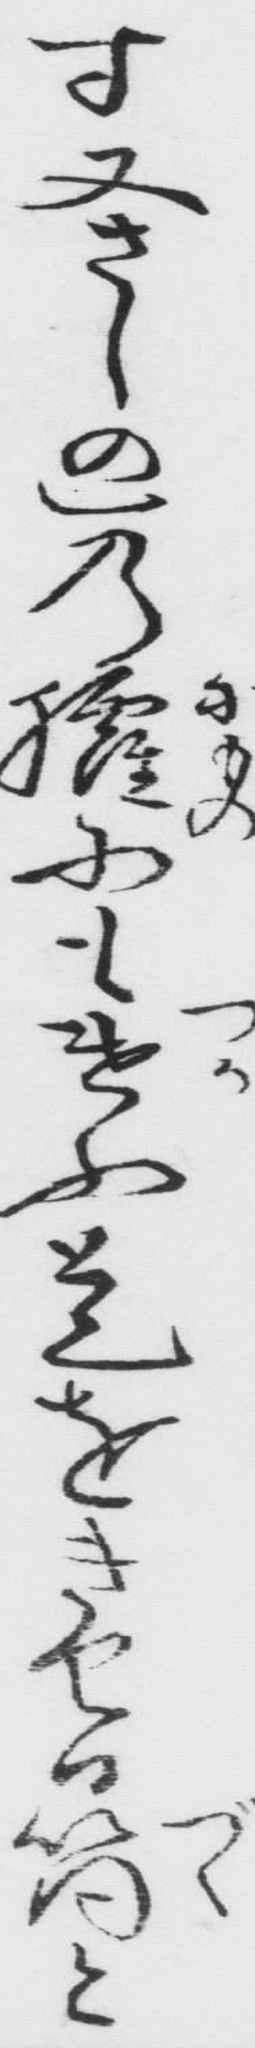す又さし込の臛にも遣ふ是をきせる筒と

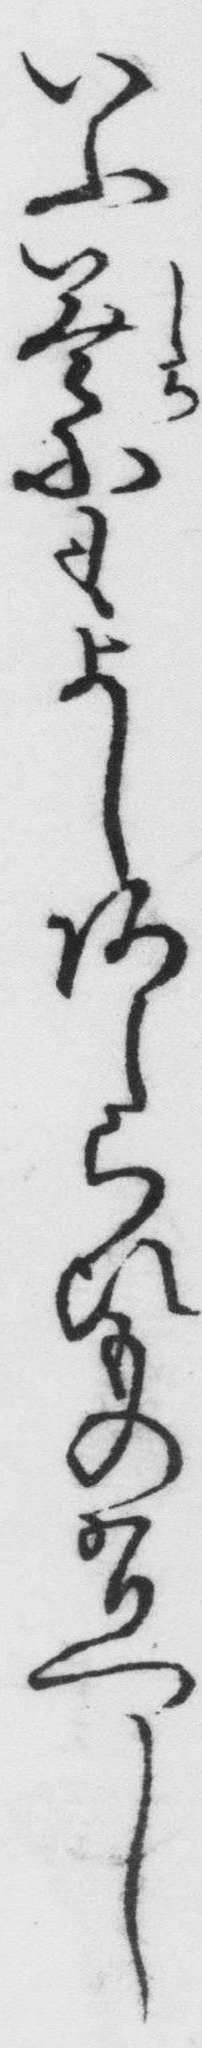いふ羹もよしあしらいもの有へし
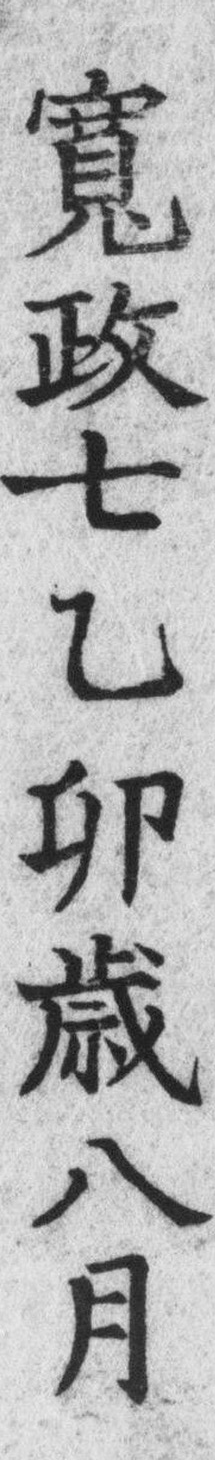寛政七乙卯歳八月
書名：海鰻百珍
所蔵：大阪府立大学学術情報センター 国文学研究資料館
